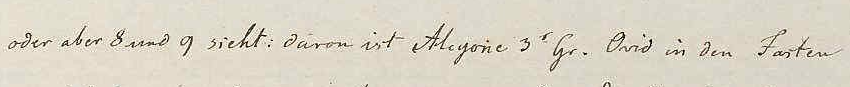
oder aber 8 und 9 sieht: davon ist Alcyone 3￼ Gr. Ovid in den Fasten
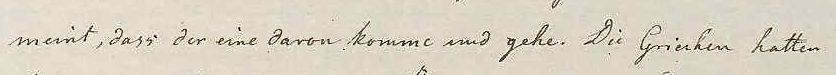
meint, dass der eine davon komme und gehe. Die Griechen hatten
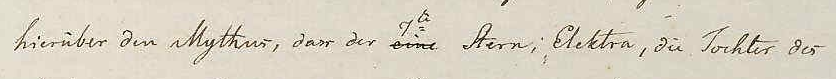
hierüber den Mythus, dass der eine7te Stern, Elektra, die Tochter des
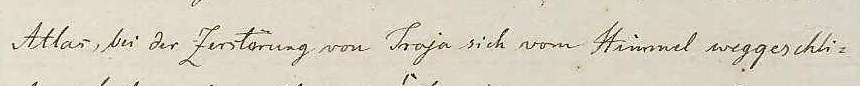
Atlas, bei der Zerstörung von Troja sich vom Himmel weggeschli-
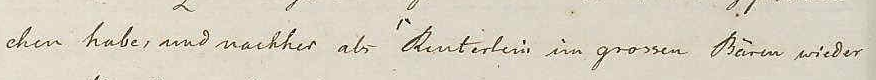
chen habe, und nachher als Reuterlein im grossen Bären wieder
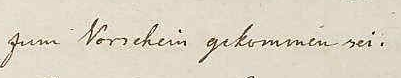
zum Vorschein gekommen sei.
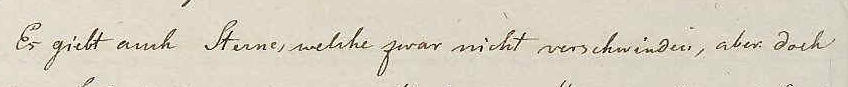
Es giebt auch Sterne, welche zwar nicht verschwinden, aber doch
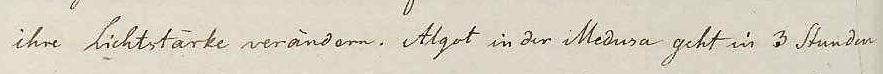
ihre Lichtstärke verändern. Algot in der Medusa geht in 3 Stunden
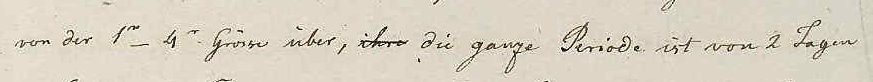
von der 1￼–4￼ Grösse über, ihre die ganze Periode ist von 2 Tagen
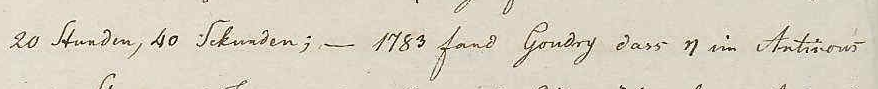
20 Stunden, 40 Sekunden; – 1783 fand Goudry dass η im Antinous
